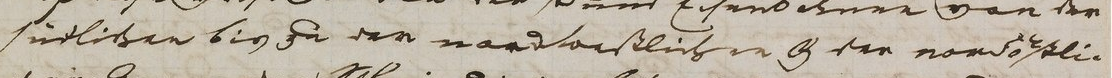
südlichen bis zu der nordwestlichen & der nordöstli-
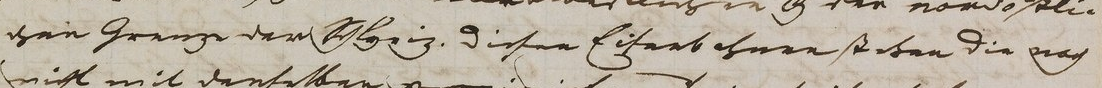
chen Grenze der Schweiz. Diesen Eisenbahnen stehen die noch
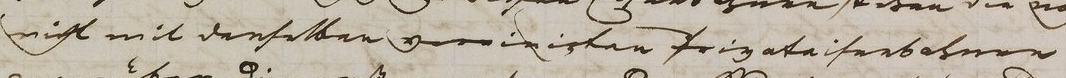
nicht mit denselben vereinigten Privateisenbahnen
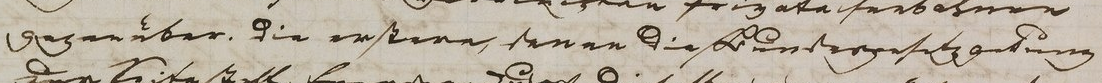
gegenüber. Die erstern, denen die Bundesgesetzgebung
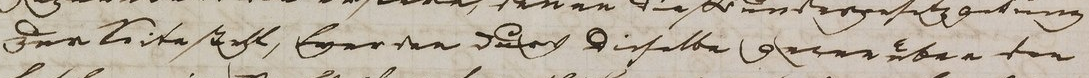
zur Seite steht, werden durch dieselbe gegenüber den
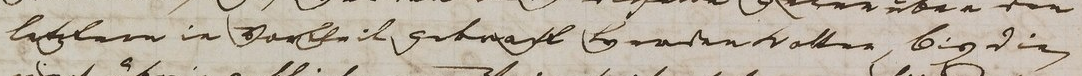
letztern in Vortheil gebracht werden wollen, bis die
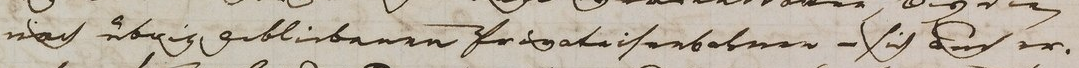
noch übrig gebliebenen Privateisenbahnen – sich auch er-
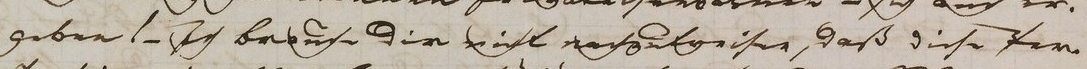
geben! – Ich brauche dir nicht nachzuweisen, daß diese Per-
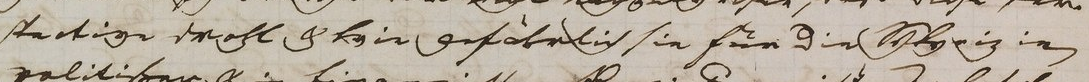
spective droht & wie gefährlich sie für die Schweiz in
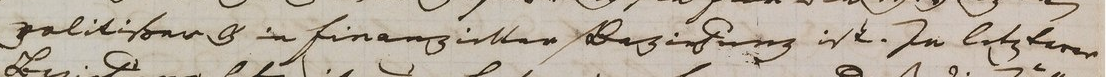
politischer & in finanzieller Beziehung ist. In letzterer
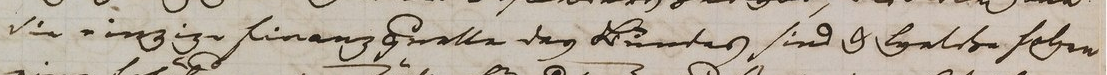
die einzige Finanzquelle des Bundes sind & welche Folgen
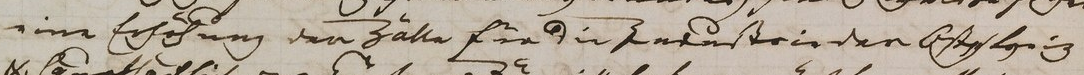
eine Erhöhung der Zölle für die Industrie der Ostschweiz
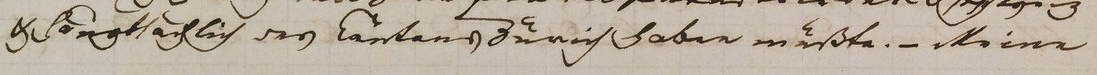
& hauptsächlich des Cantons Zürich haben müßte. – Meine
